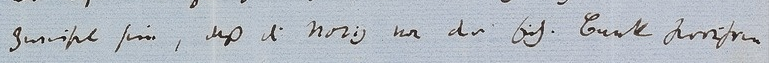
Zweifel sein, daß die Notiz von der Eidg. Bank herrühren
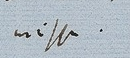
müsse.
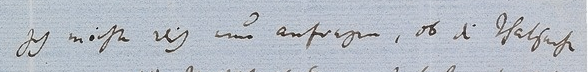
Ich möchte Dich nun anfragen, ob die Thatsache
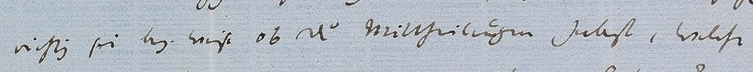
richtig sei bez.weise ob Du Mittheilungen habest, welche
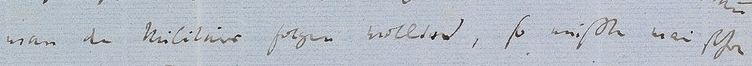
man den Militärs folgen wollte, so müßte man schon
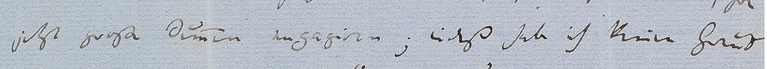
jetzt große Summen engagiren; indeß habe ich keinen Grund
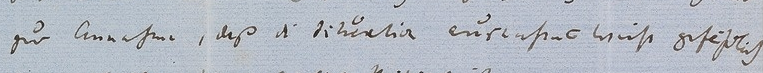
zur Annahme, daß die Situation ausnahmsweise gefährlich
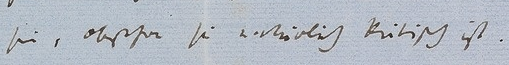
sei, obschon sie natürlich kritisch ist.
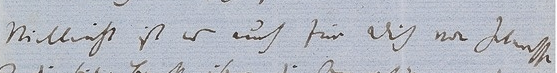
Vielleicht ist es auch für Dich von Interesse
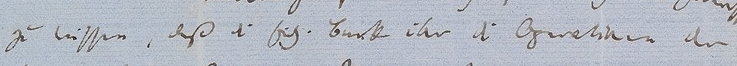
zu wissen, daß die Eidg. Bank über die Operationen der
